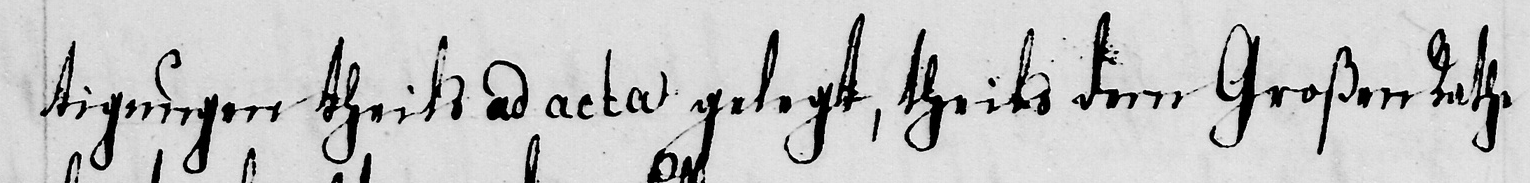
tigungen theils ad acta gelegt, theils dem Großen Rathe
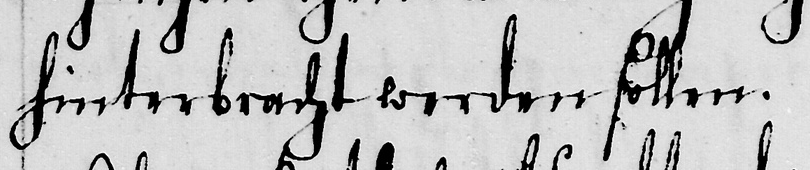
hinterbracht werden sollen.
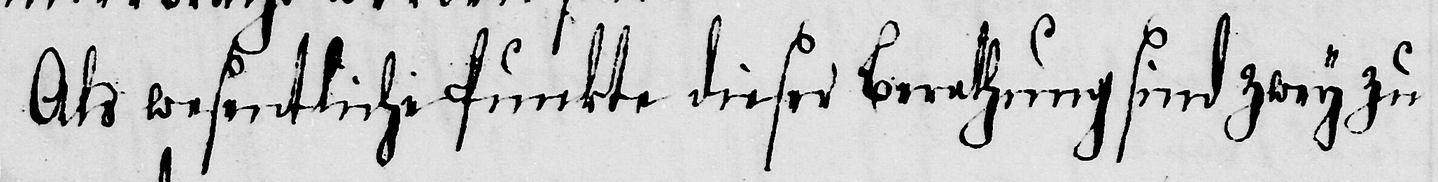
Als wesentliche Punkte dieser Berathung sind zwey zu
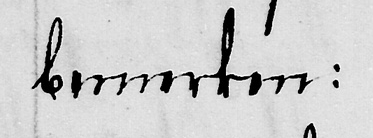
bemerken:
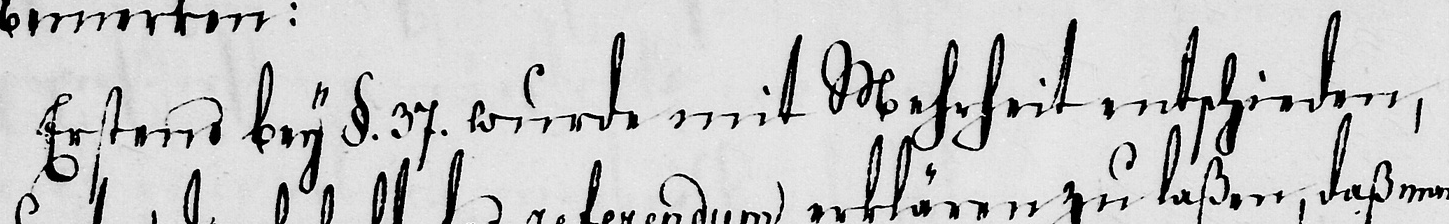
Erstens bey §. 37. wurde mit Mehrheit entschieden,
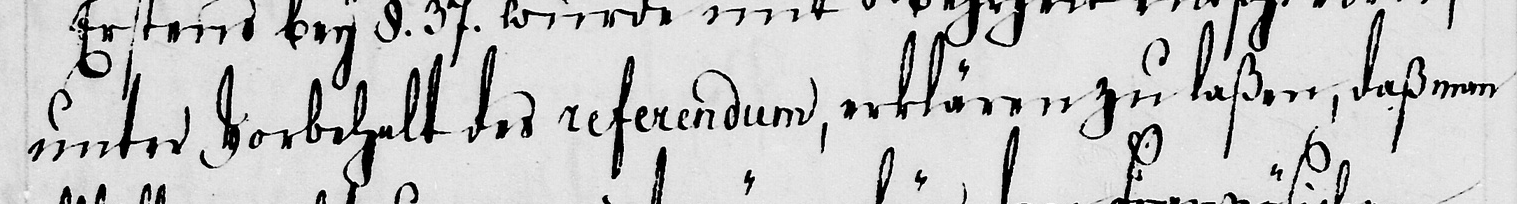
unter Vorbehalt des referendum, erklären zu laßen, daß man
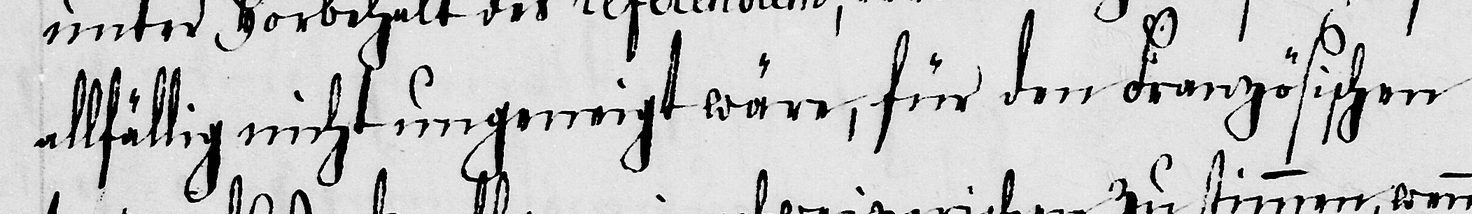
allfällig nicht ungeneigt wäre, für den Französischen
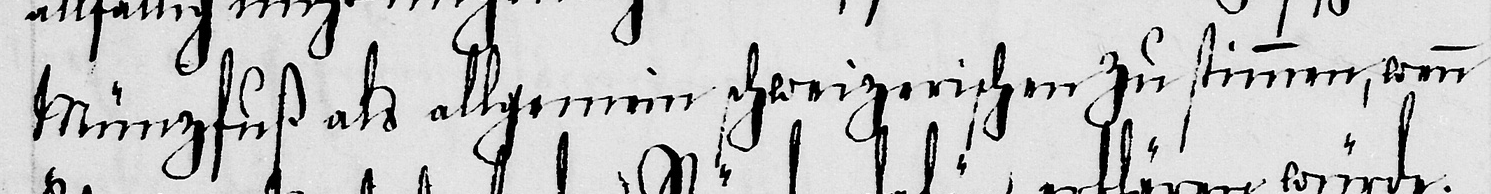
Münzfuß als allgemein schweizerischen zu stimmen, wenn
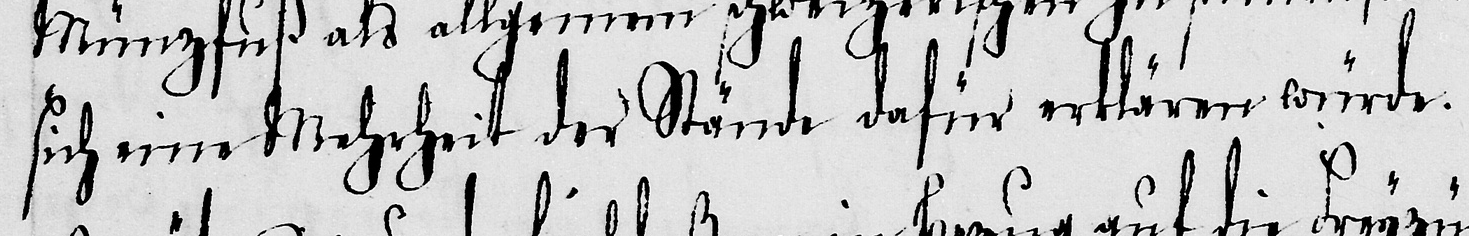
sich eine Mehrheit der Stände dafür erklären würde.
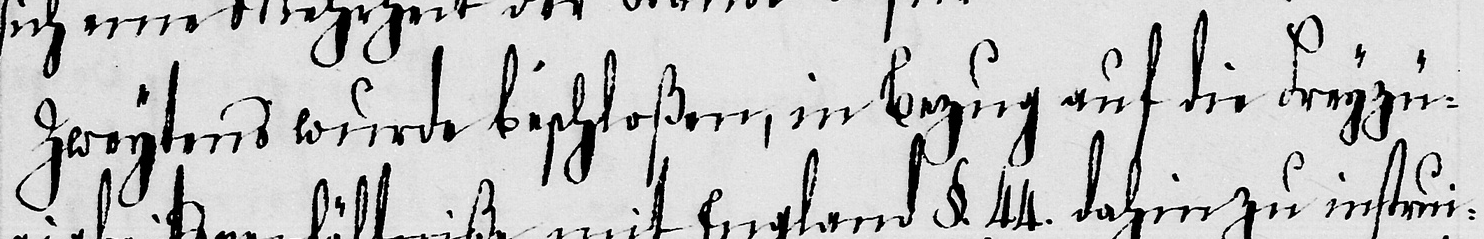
Zweytens wurde beschloßen, in Bezug auf die Freyzü¬
